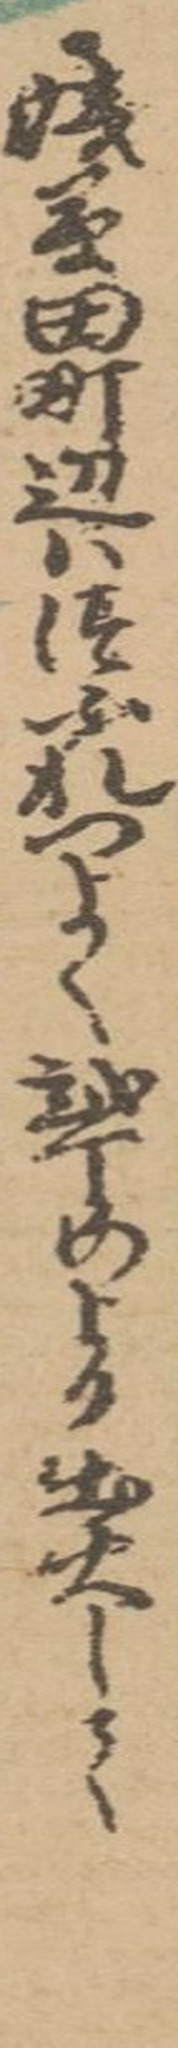浅草田町辺はつぶれつよく弐丁めより出火して
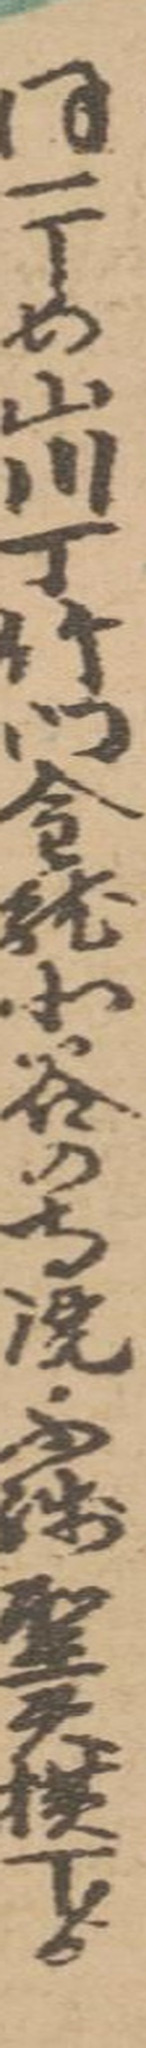同一丁め山川丁竹内金龍北谷の寺院不残聖天横下ゟ
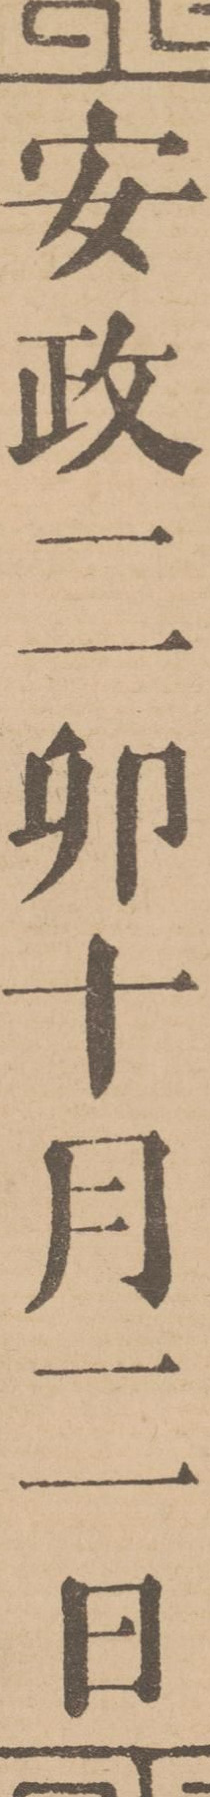安政ニ卯十月二日
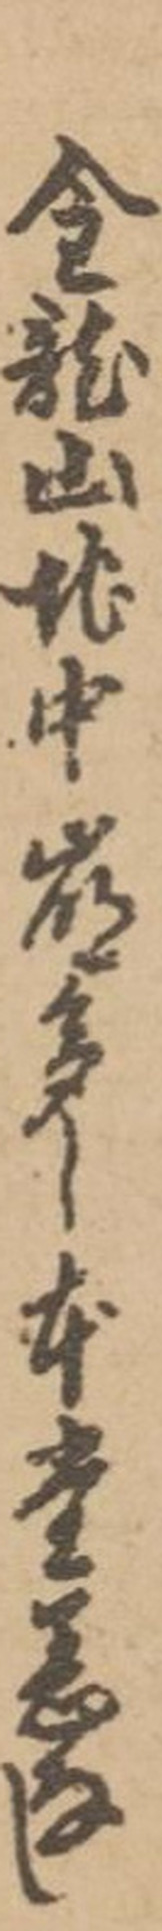金龍山地中崩多し本堂恙なし
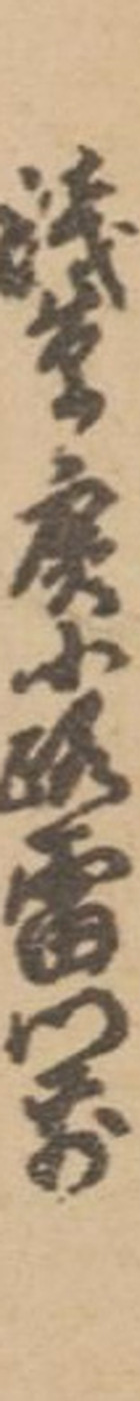浅草広小路雷門前
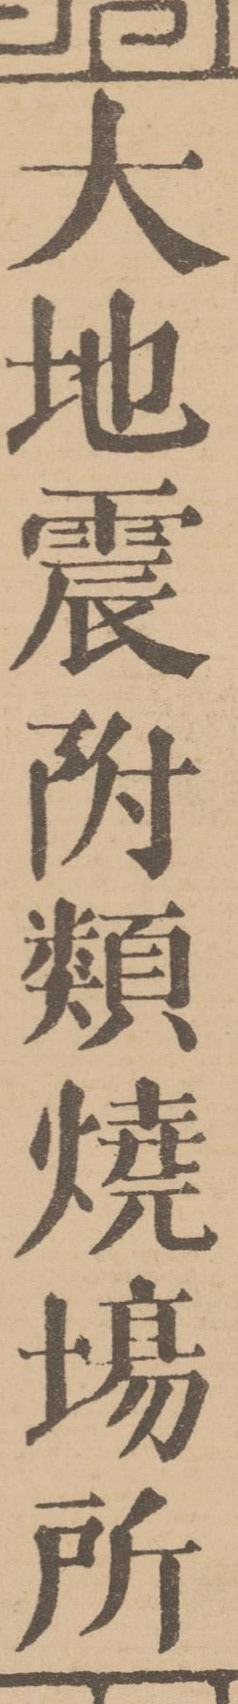大地震附類焼場所
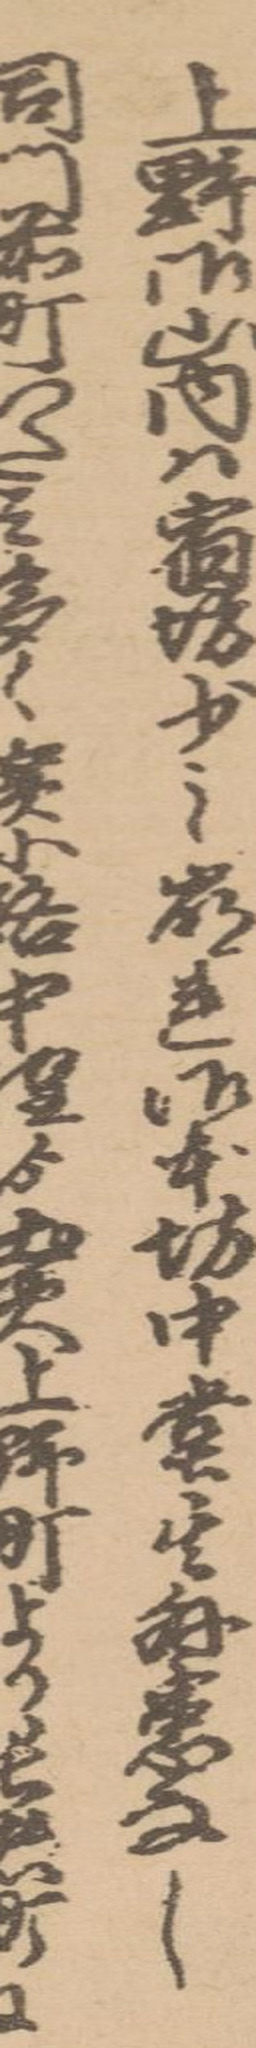同門前町いたみ多く広小路中程ゟ出火上野町より長者町に
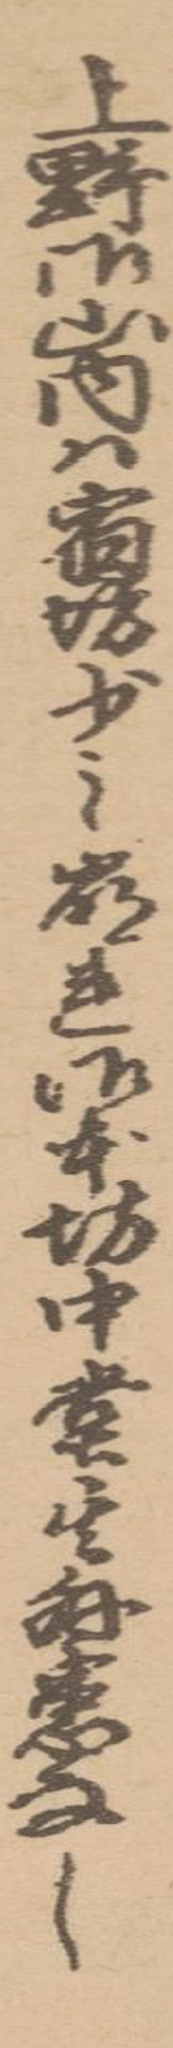上野御山内は宿坊少々崩れ御本坊中堂其外患なし
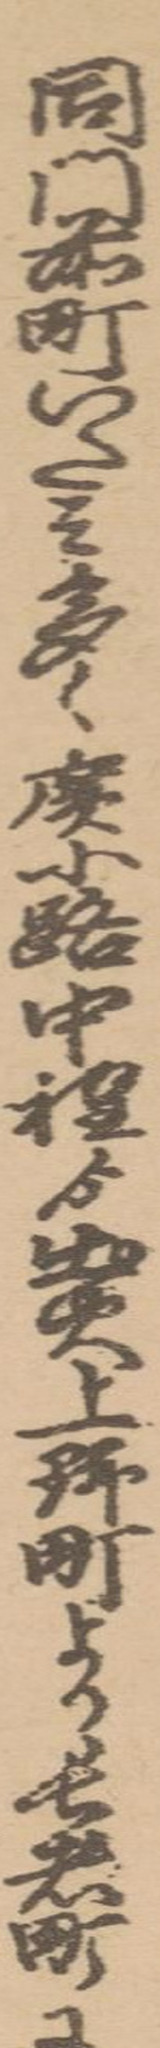同門前町いたみ多く広小路中程ゟ出火上野町より長者町に
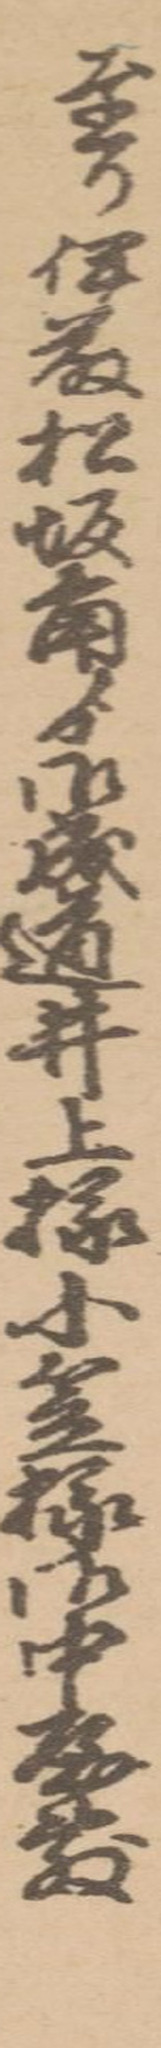至り伊藤松坂南ゟ御成道井上様小笠様御中屋敷
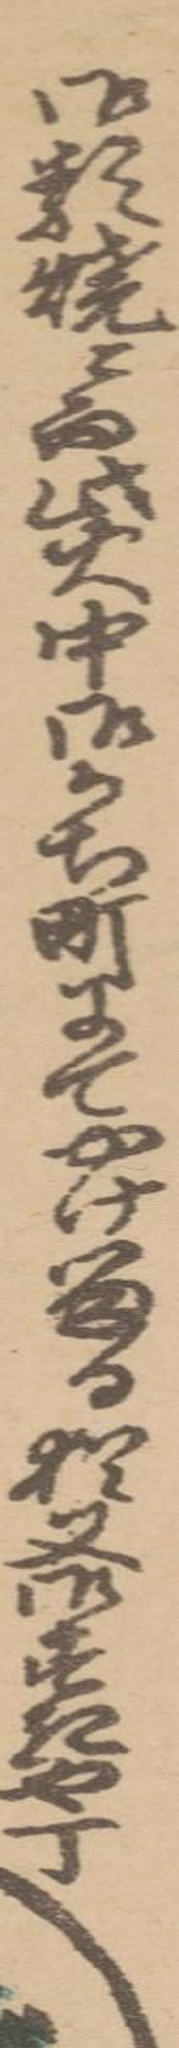御類焼ニ而此火中御かち町にてやけ留る猶又御すきや丁
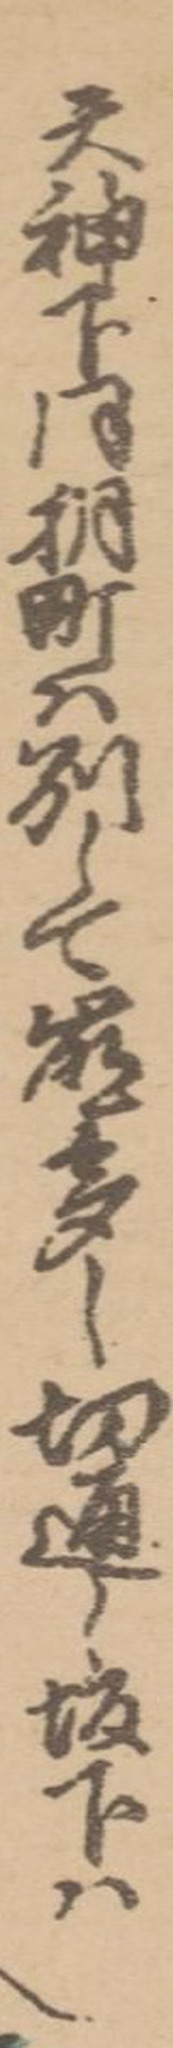天神下同朋町は別して崩多し切通し坂下は
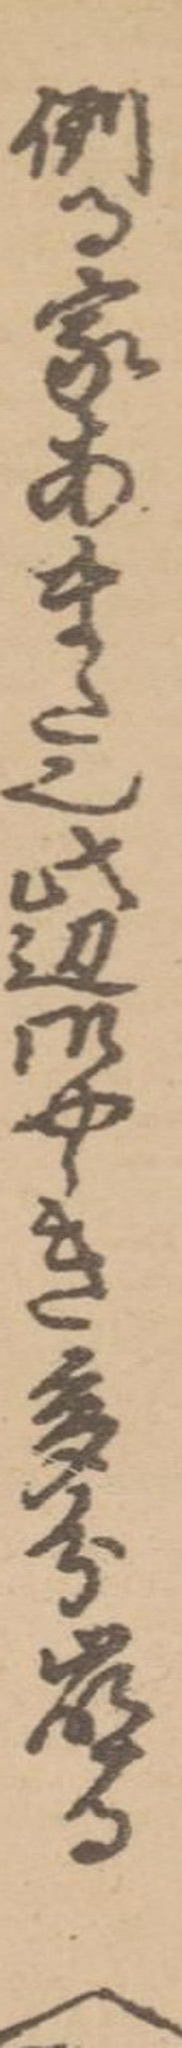倒る家あまた也此辺御やしき多分崩る
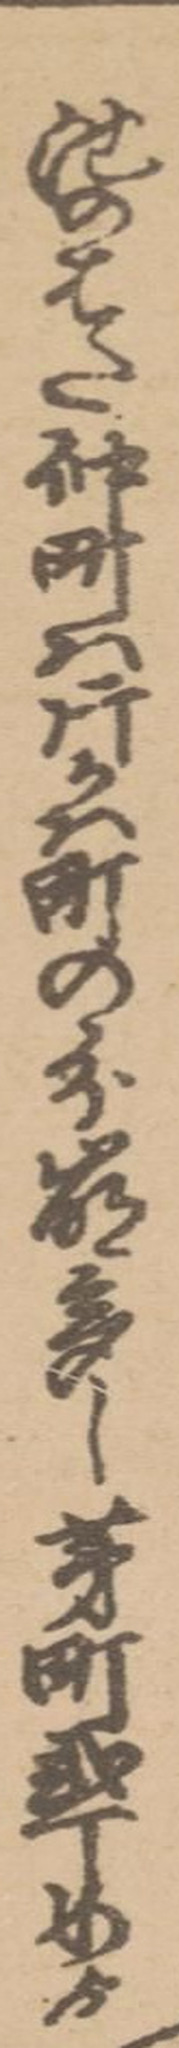池のはた仲町は片かは町の分崩多し茅町弐丁めゟ
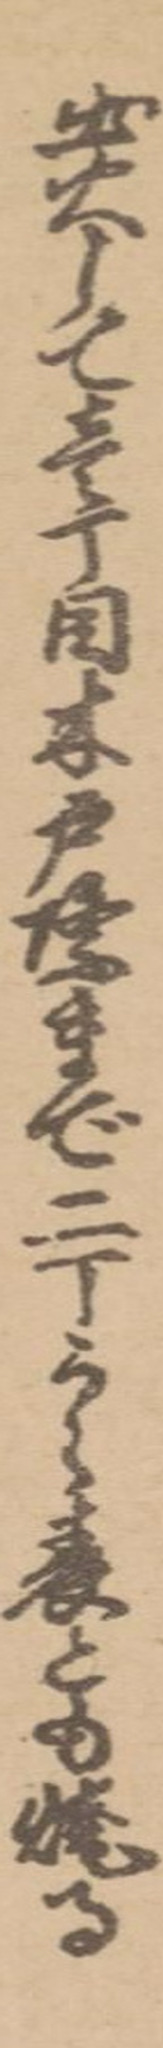出火して壱丁目木戸際まで二丁うら表とも焼る
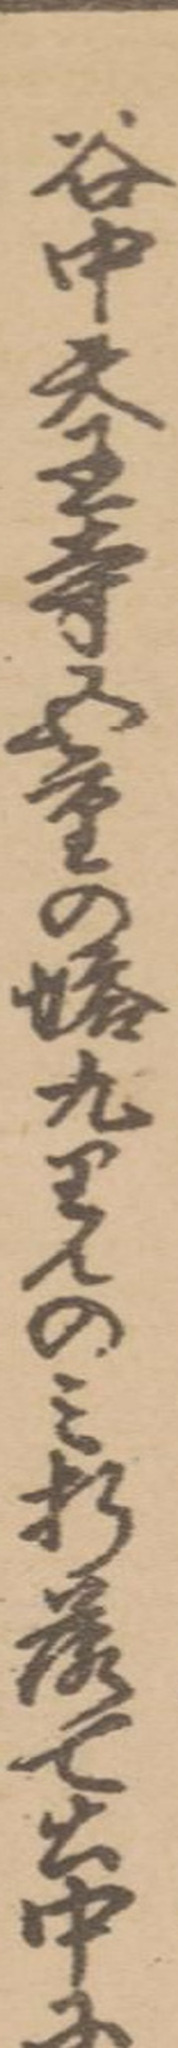谷中天王寺五重の塔九りんのみ折落て土中に
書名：安政二卯十月二日大地震附類焼場所
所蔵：東京大学地震研究所図書室 Earthquake Research Institute Library, The University of Tokyo, JAPAN
